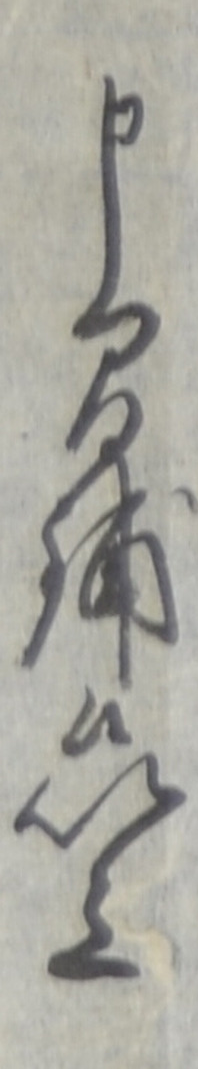申間鋪候以上
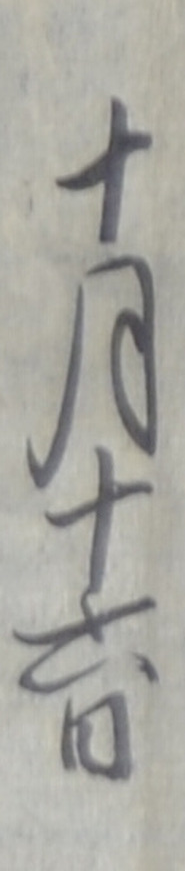十月十六日
